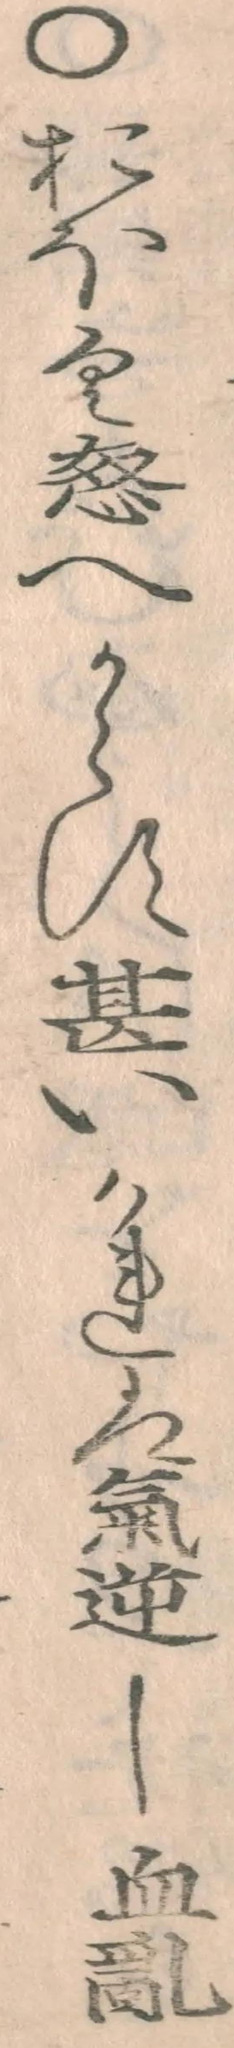〇おほく怒へからす甚いかれは気逆し血乱
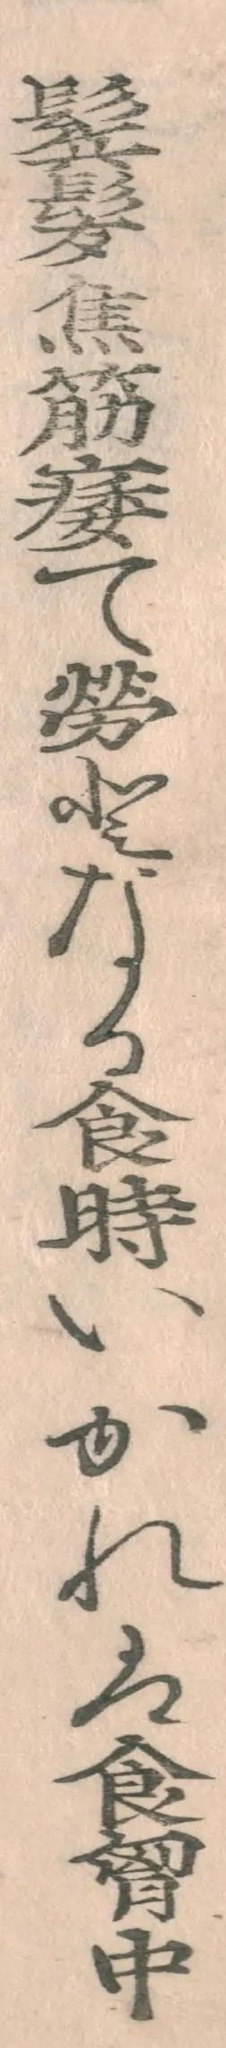鬢髪焦筋痿て労となる食時いかれは食胸中
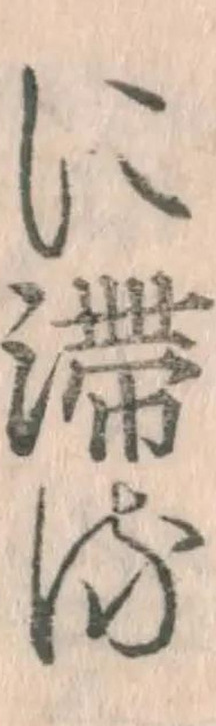に滞る
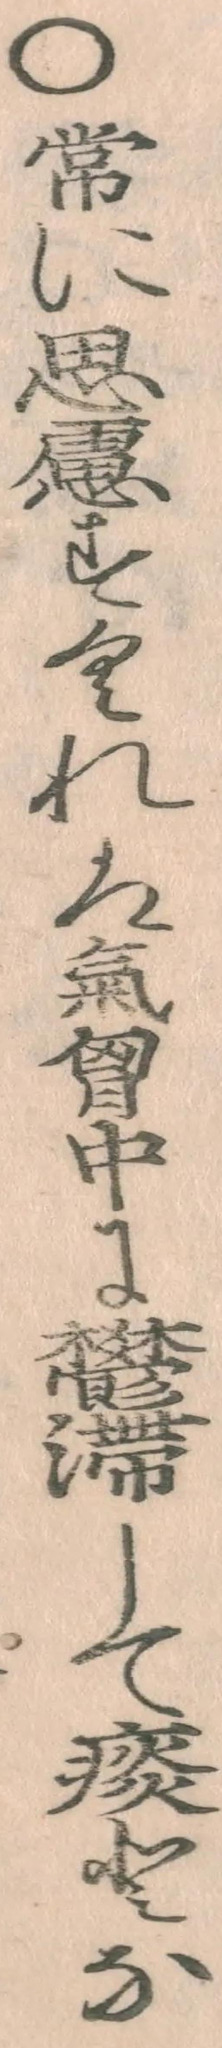〇常に思慮すくれは気胸中に鬱滞して痰とな
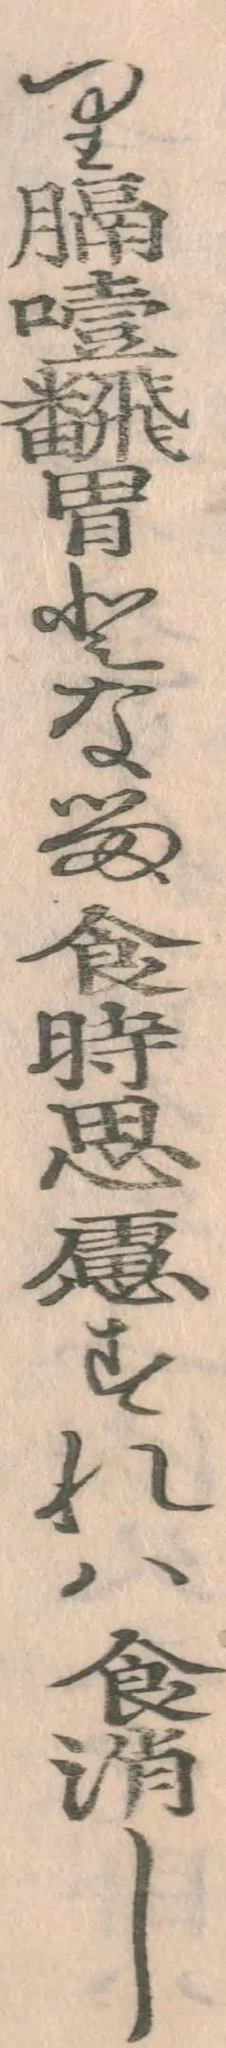り腷噎翻胃となる食時思慮すれは食消し
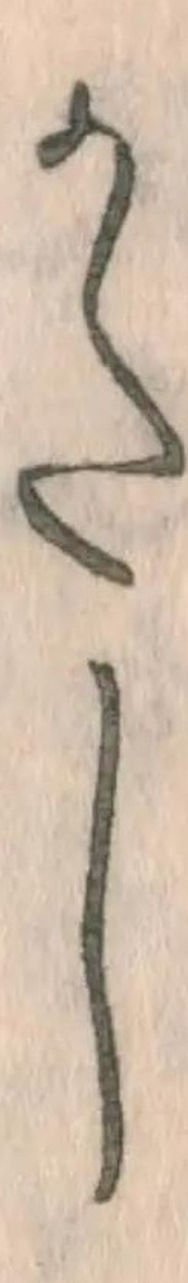かたし
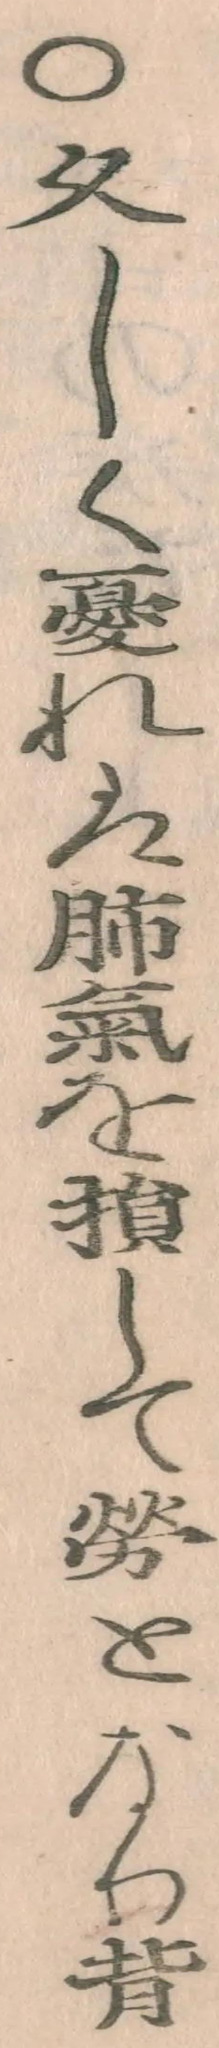〇久しく優れは肺気を損して労となり背
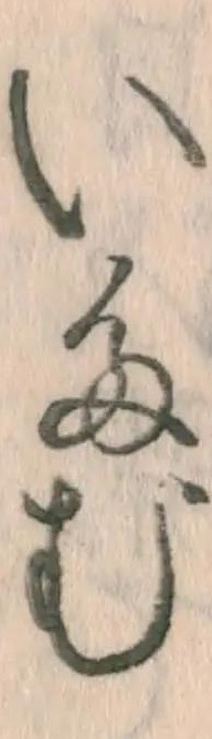いたむ
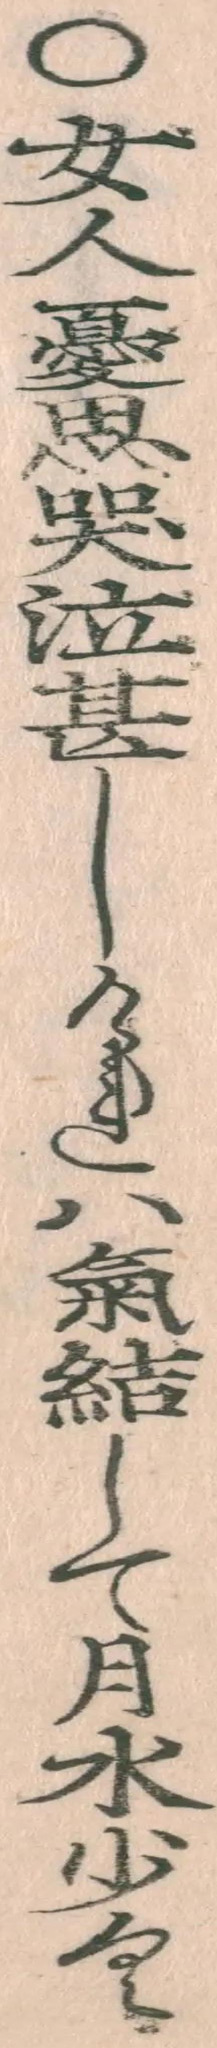〇女人憂思哭泣甚しけれは気結して月水少く
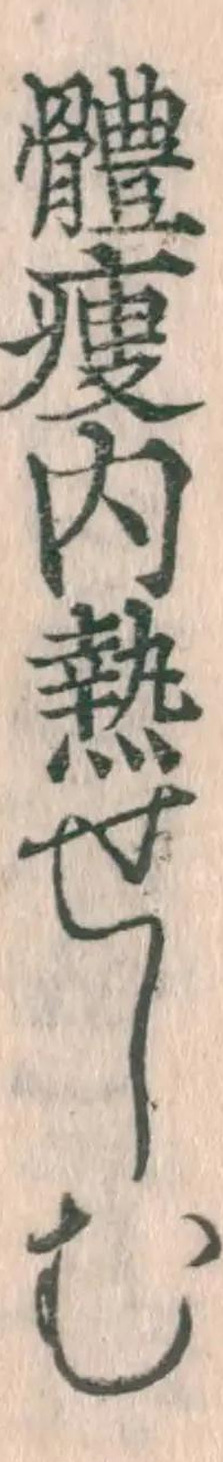体痩内熱せしむ
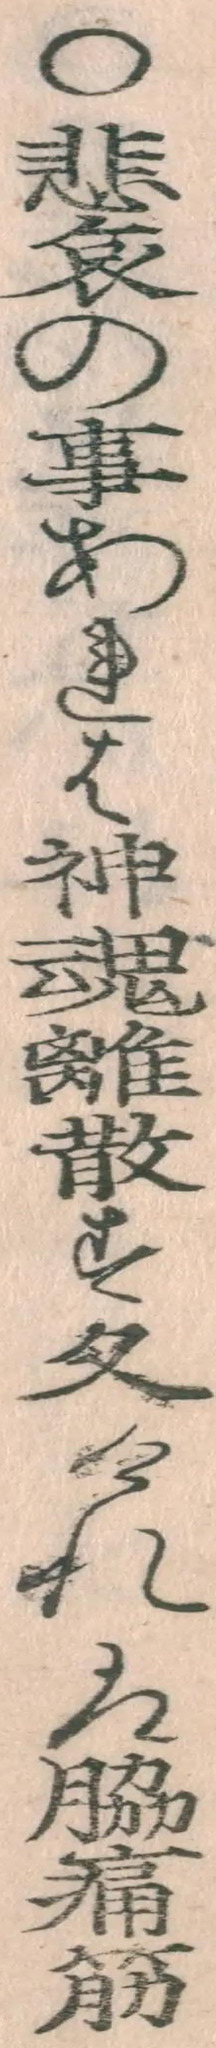〇悲哀の事あれは神魂離散す久けれは脇痛筋
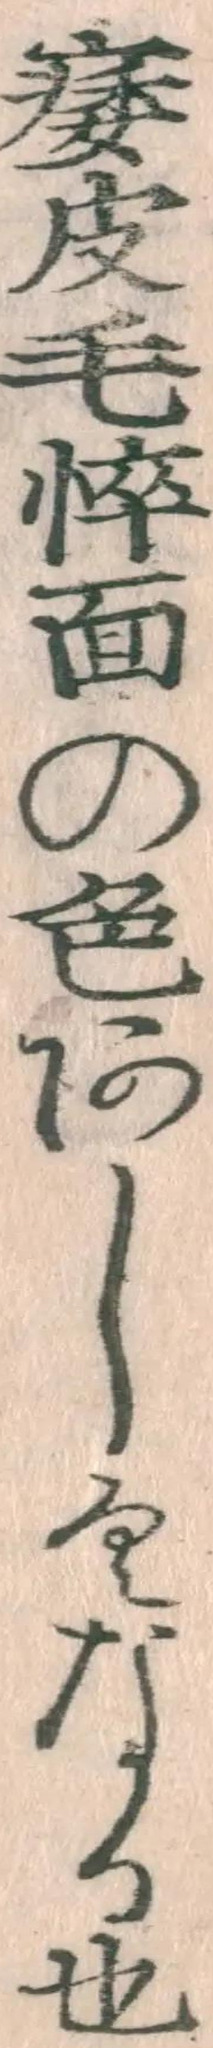痿皮毛悴面の色あしくなる也
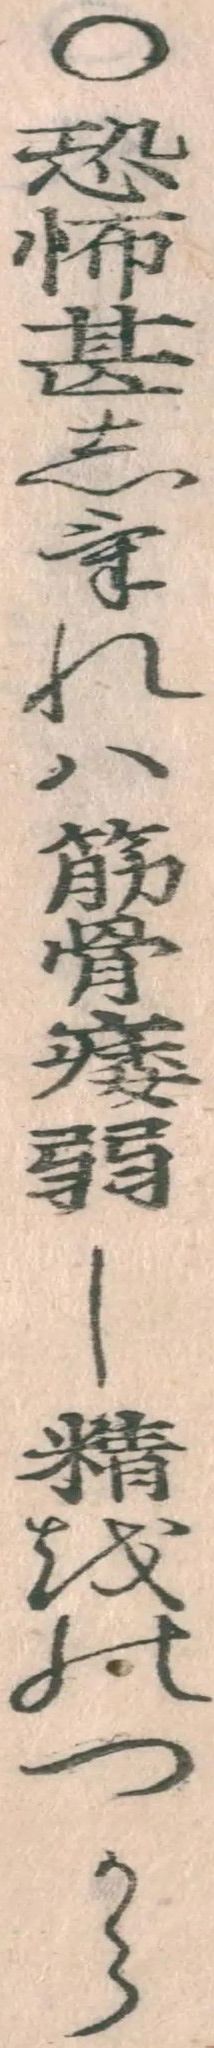〇恐怖甚しけれは筋骨痿弱し精をのつから
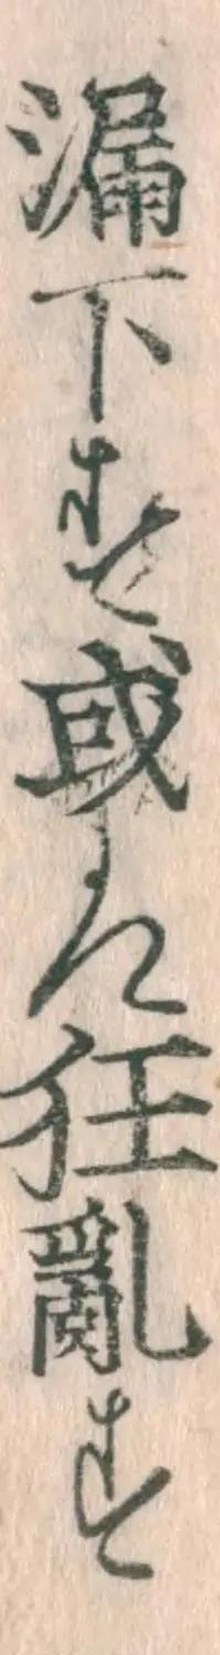漏下す或は狂乱す
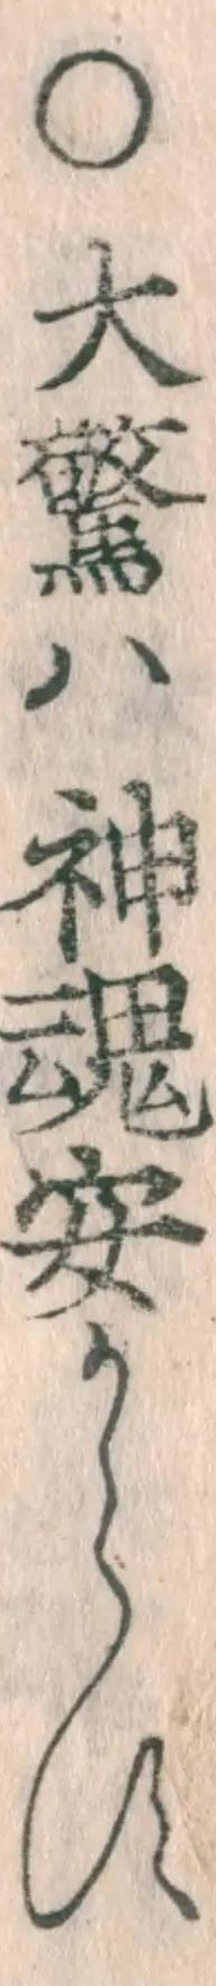〇大驚は神魂安からす
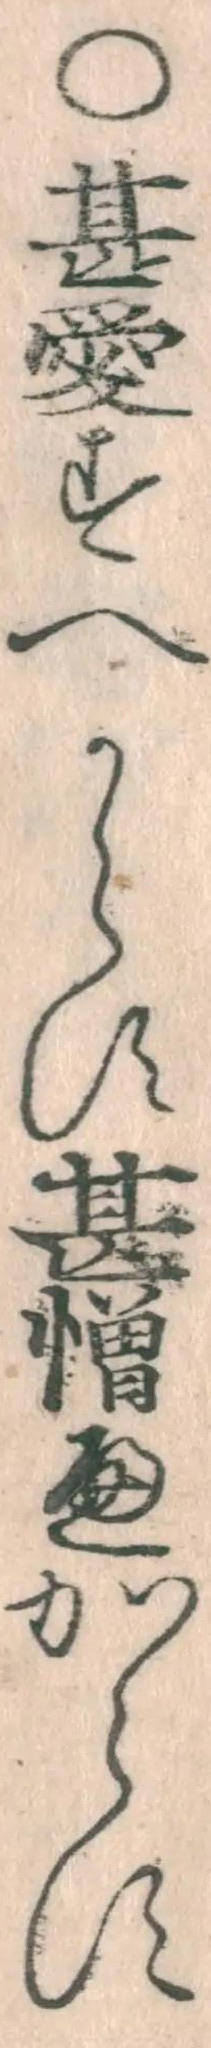〇甚愛すへからす甚憎へからす
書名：延壽撮要
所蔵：国立国会図書館 National Diet Library, JAPAN
